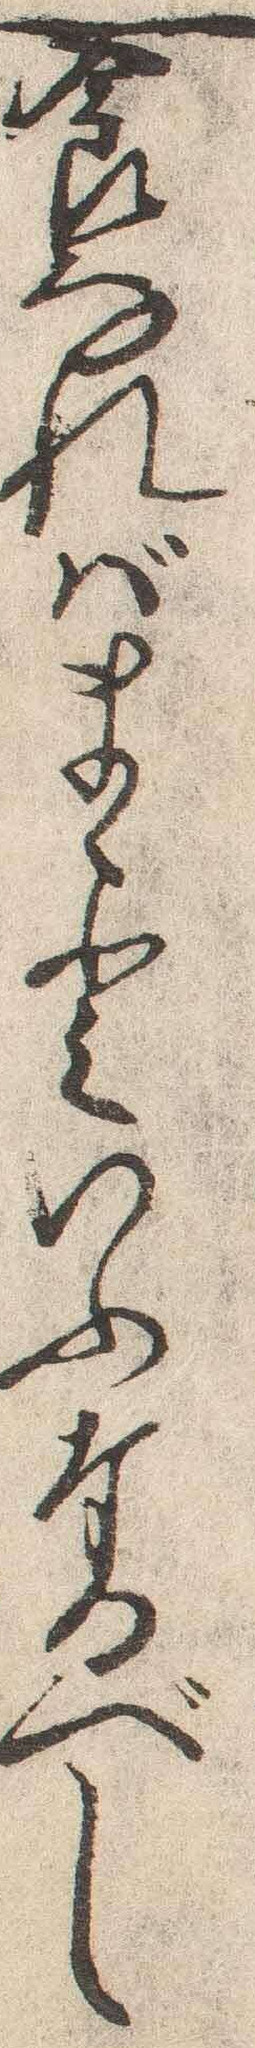食なればまゝといふなるべし
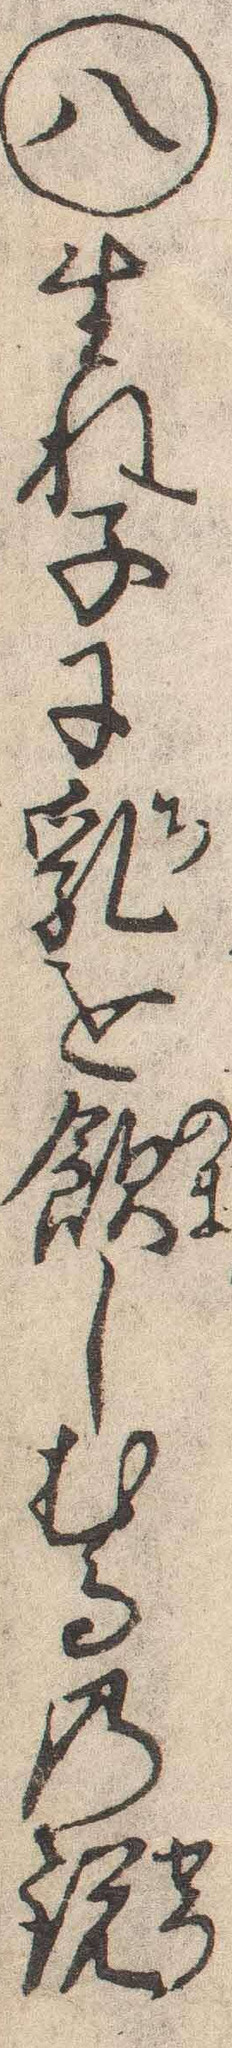㊇生れ子に乳を飲しむるの説

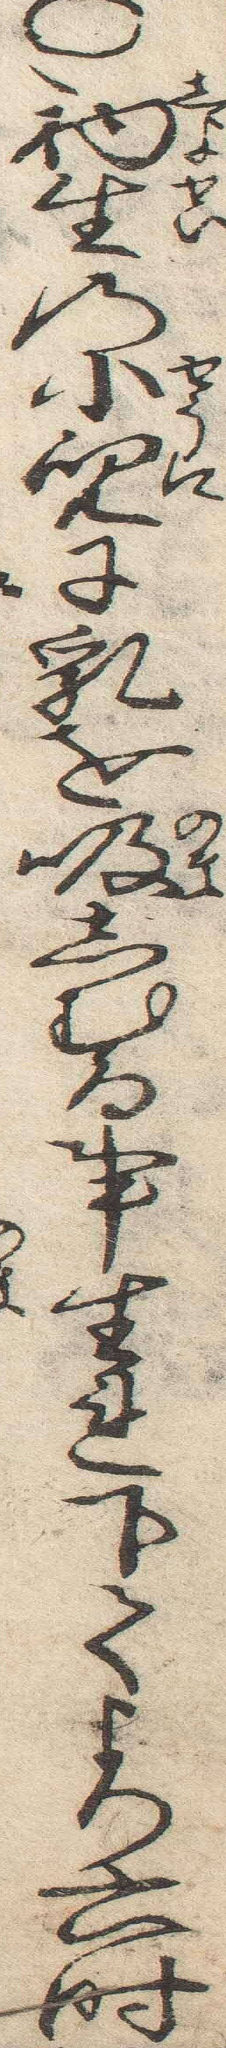◯初生の小児に乳を吸しむる事生れ下てより六時
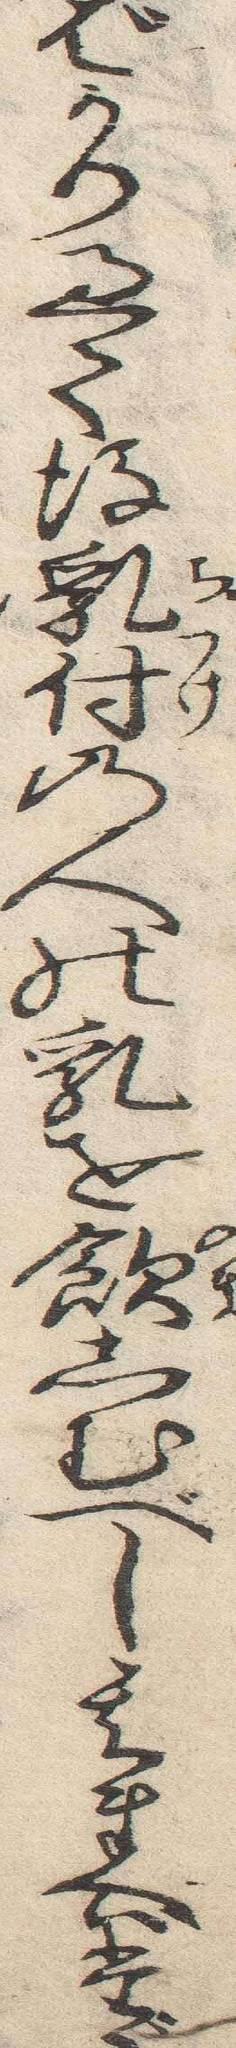ばかり過て後乳付の人の乳を飲しむべし其まへはたゞ
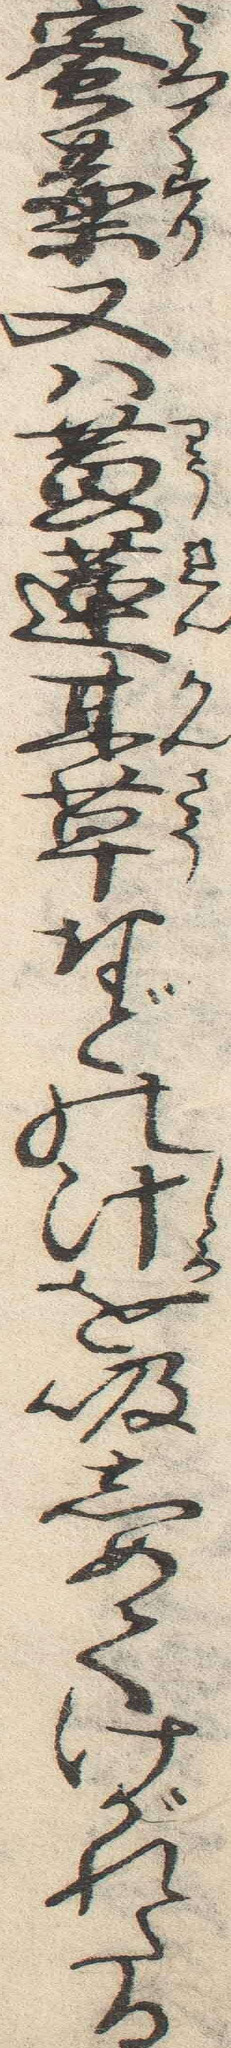蜜薬又は黄蓮甘草などの汁を吸しめてけがれたる
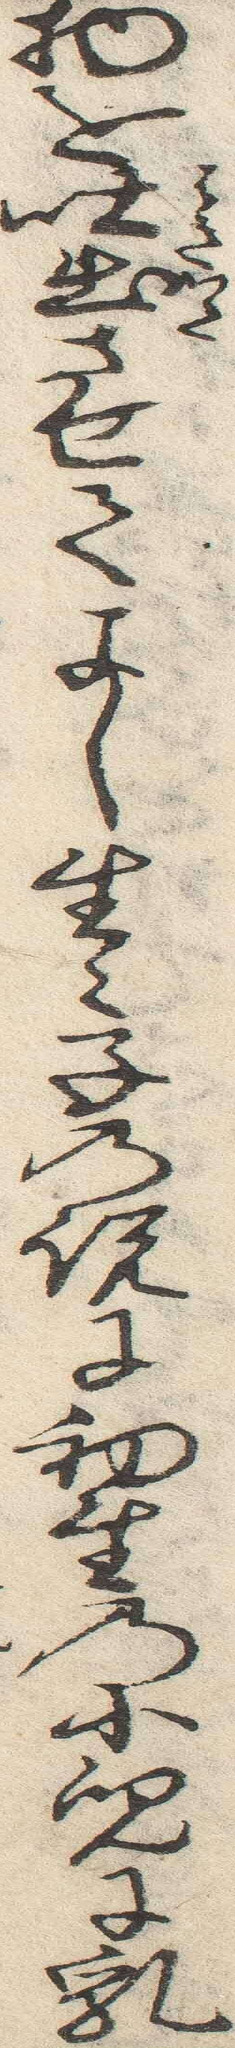物を吐出させてよし生々子の説に初生の小児に乳
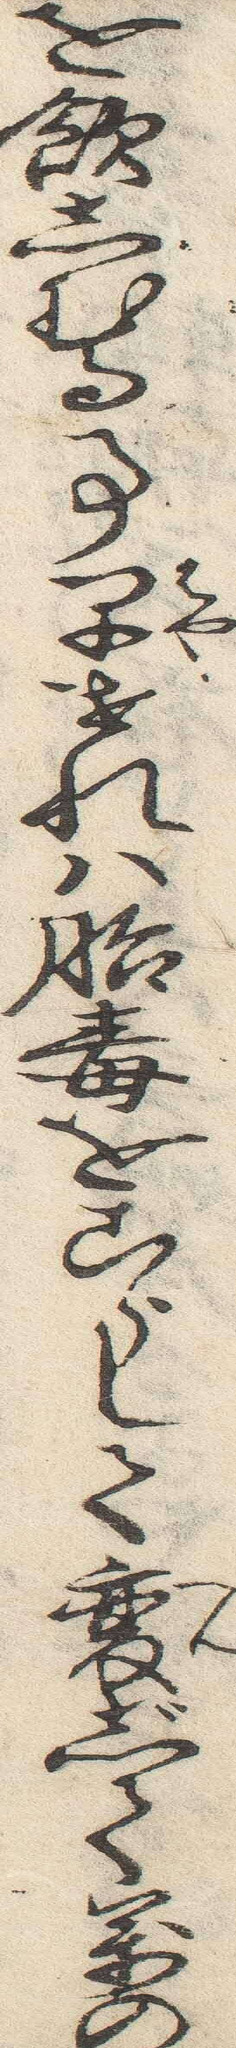を飲しむる事早けれは胎毒をこらして変じて萬の
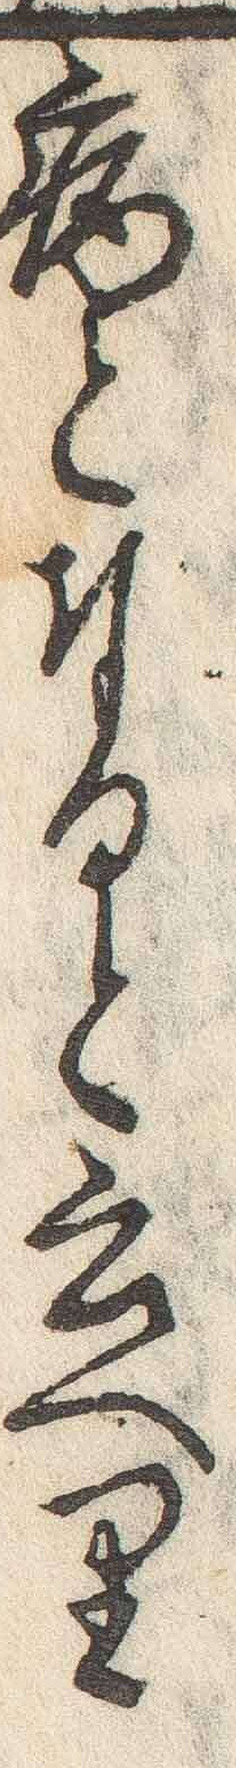病となると云へり
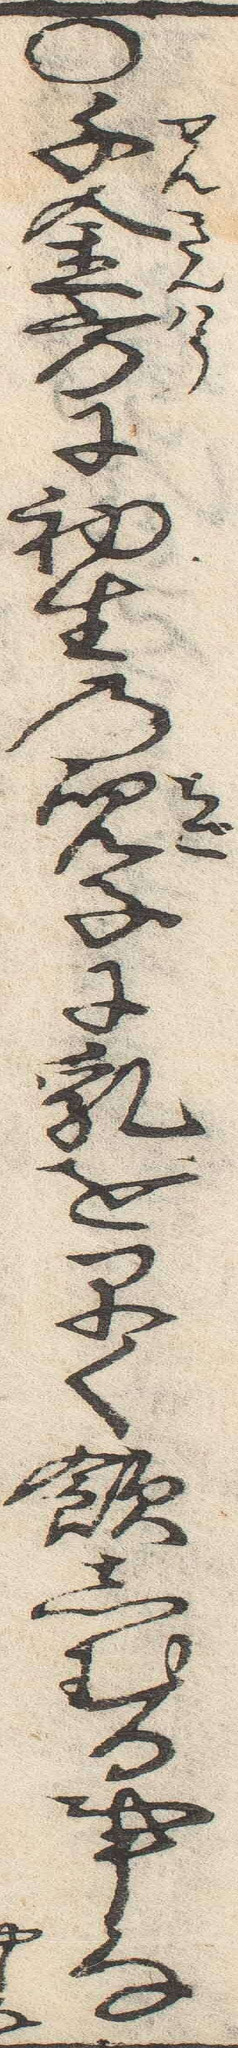◯千金方に初生の児子に乳を早く飲しむる事な
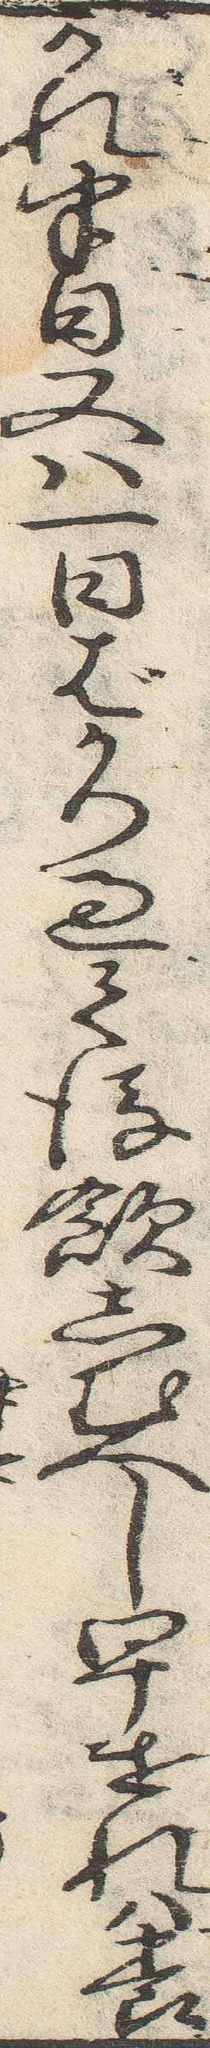かれ半日又は一日ばかり過て後飲しむへし早けれは養
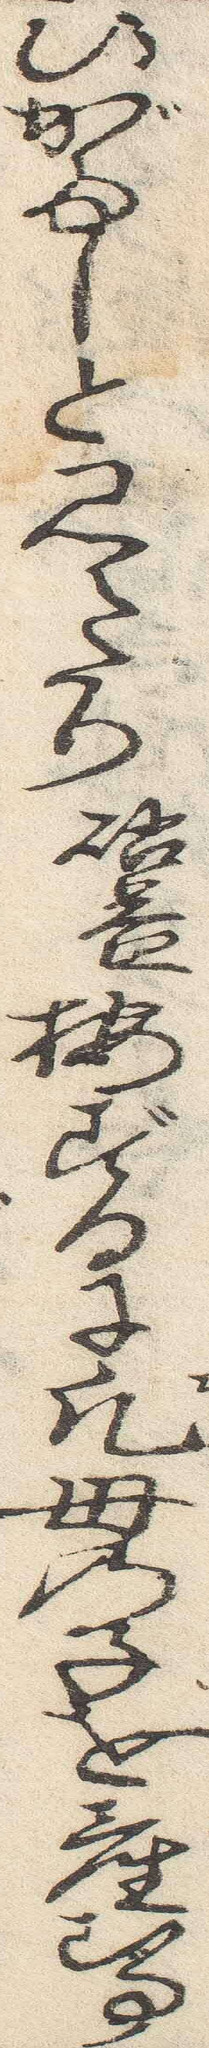ひがたしと見えたり啓益按ずるに凢母の子を産む事
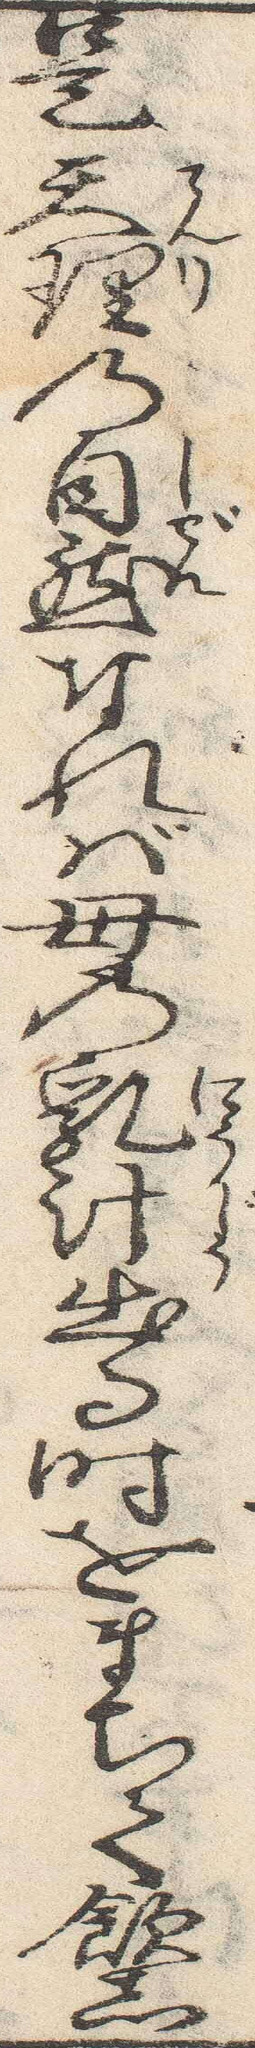是天理の自然なれば母の乳汁出る時をまちて飲し
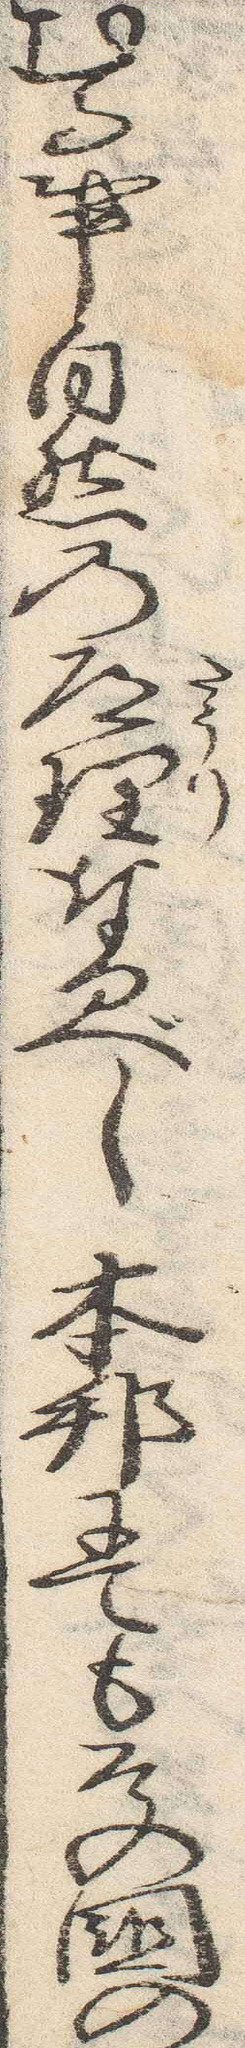むる事自然の道理なるべし本邦にてもその國の
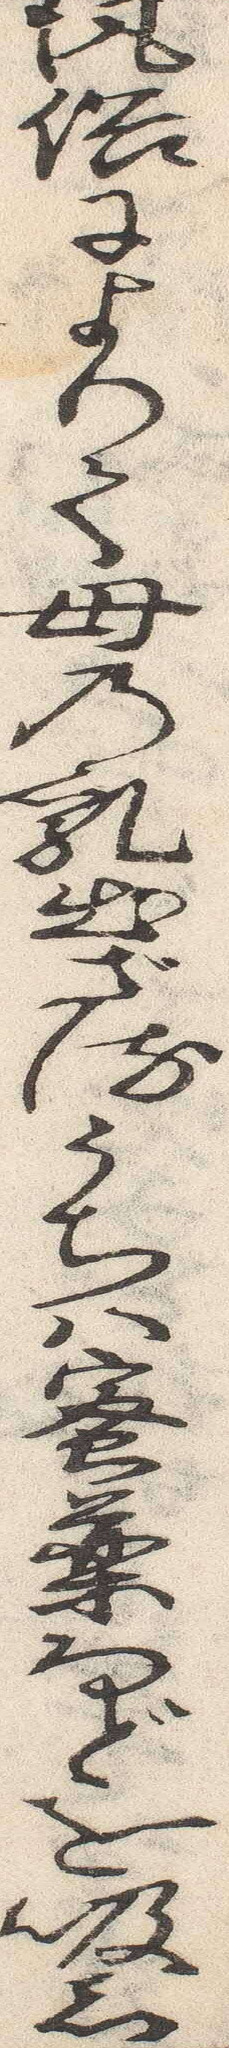風俗によりて母の乳出ざるうちは蜜薬などを吸し
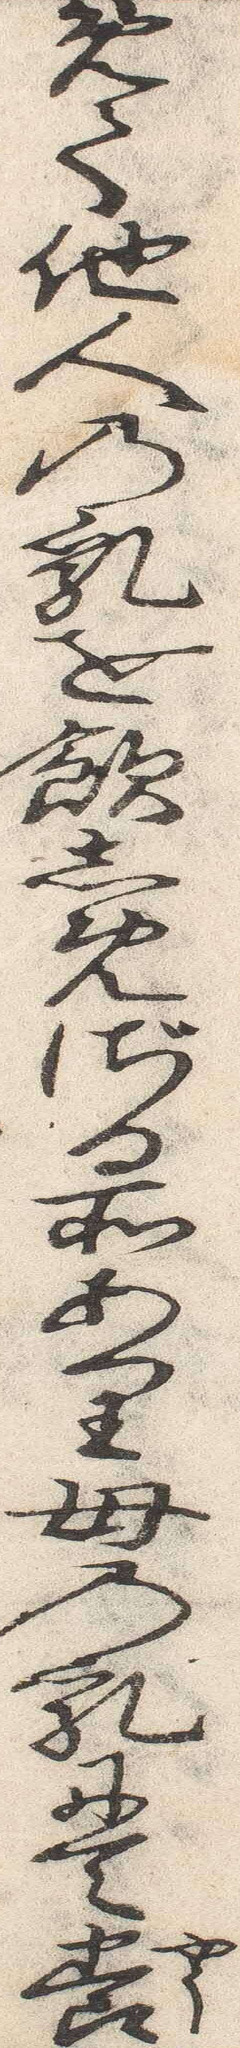めて他人の乳を飲しめざる所あり母の乳にて養
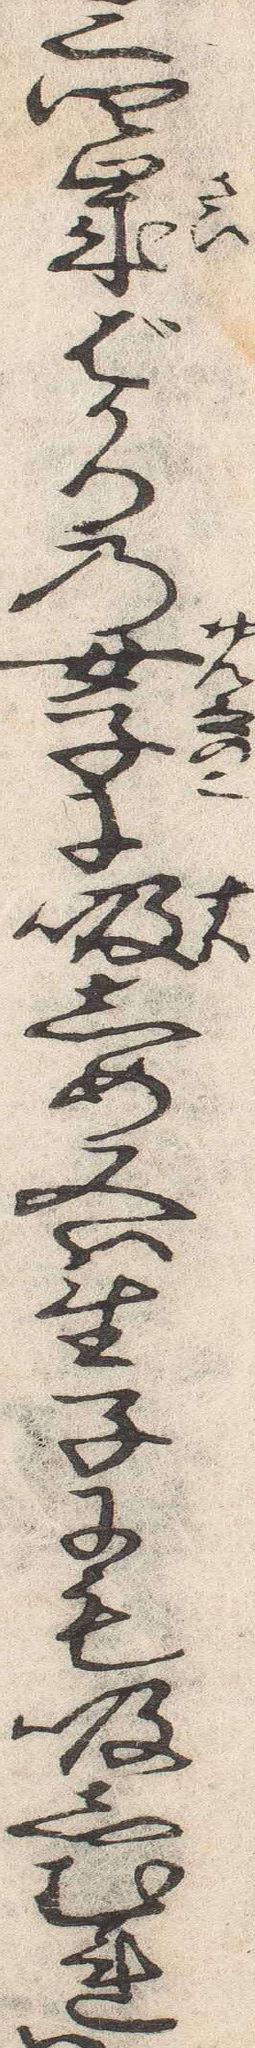三四歳ばかりの女子に吸しめ又は生子にも吸しむれは
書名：小児必用養育草
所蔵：東京学芸大学附属図書館 国文学研究資料館
